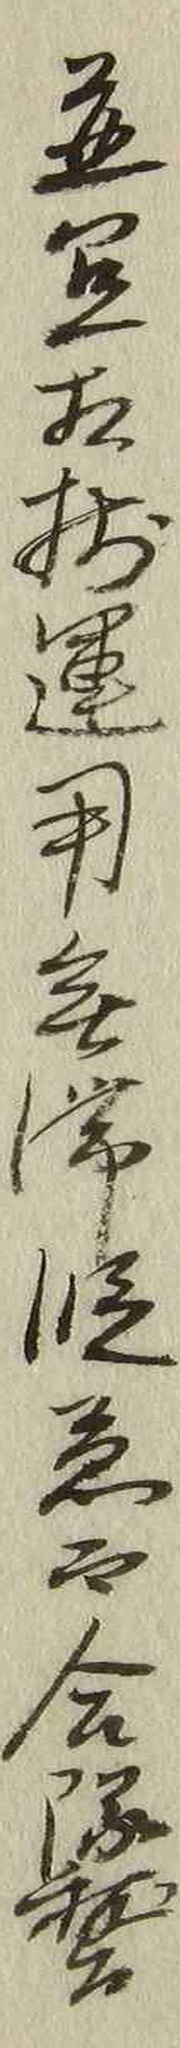並宜相揃運用無滞段兼而合隊稽
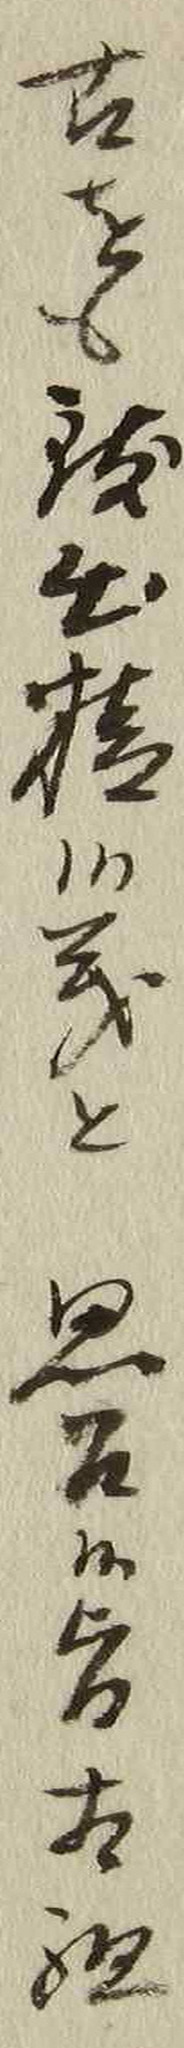古をも致出精候義と思召候旨相組
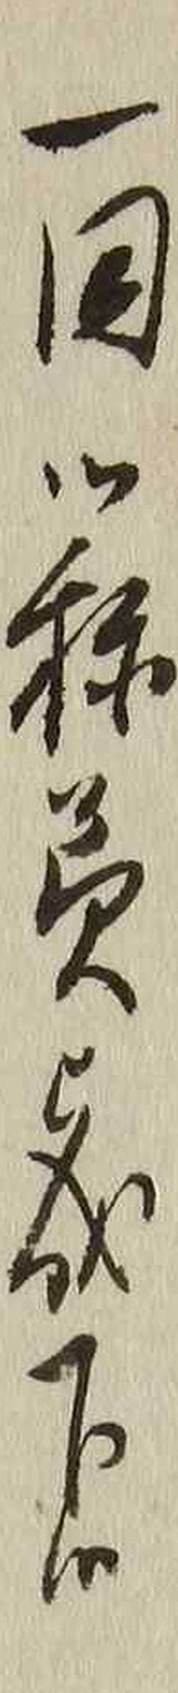一同御称美被成下候
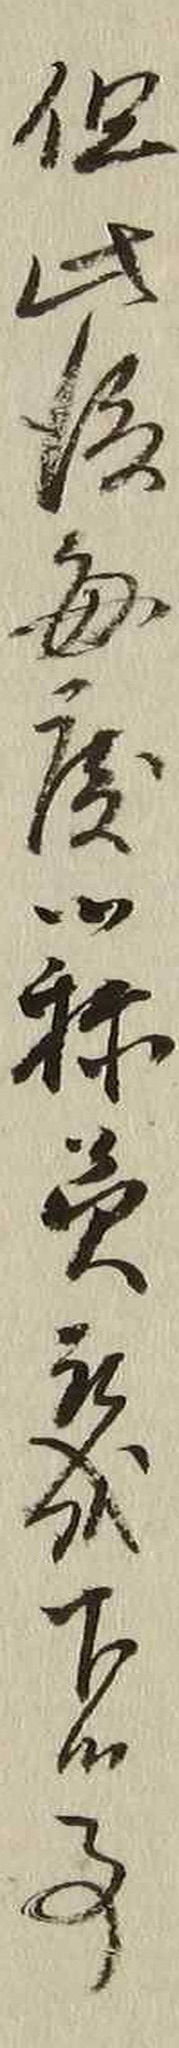但此後毎度御称美被成下候事
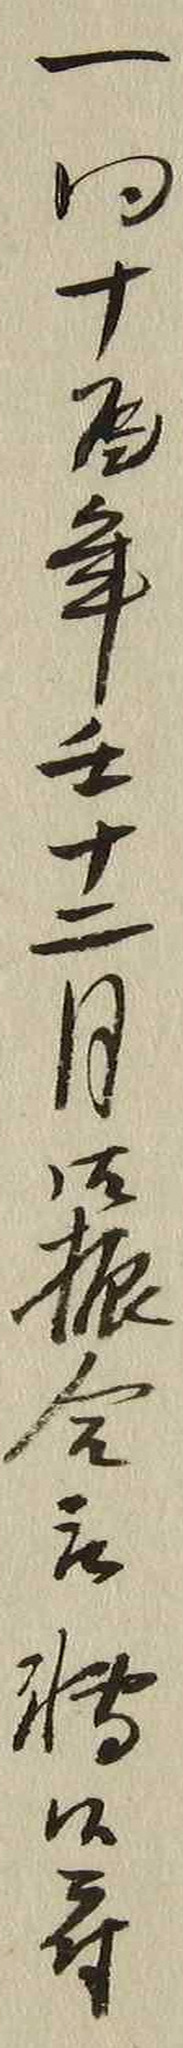一同十酉年閏十二月御振合被転候ニ付
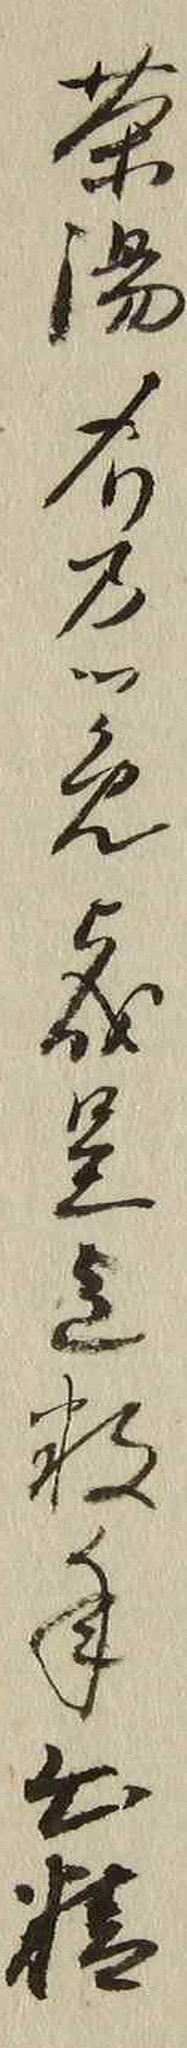茶湯〆り方御免被成是迄数年出精
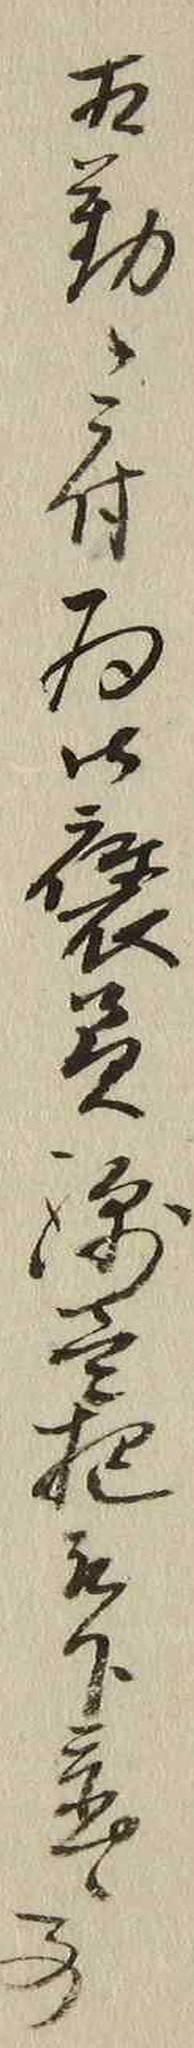相勤候ニ付為御褒美綿壱把被下置候事
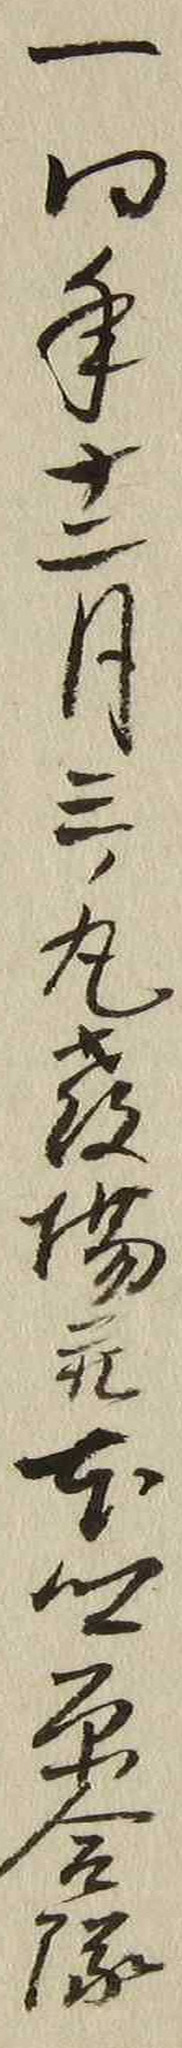一同年十二月三ノ丸教場并本郷原合隊
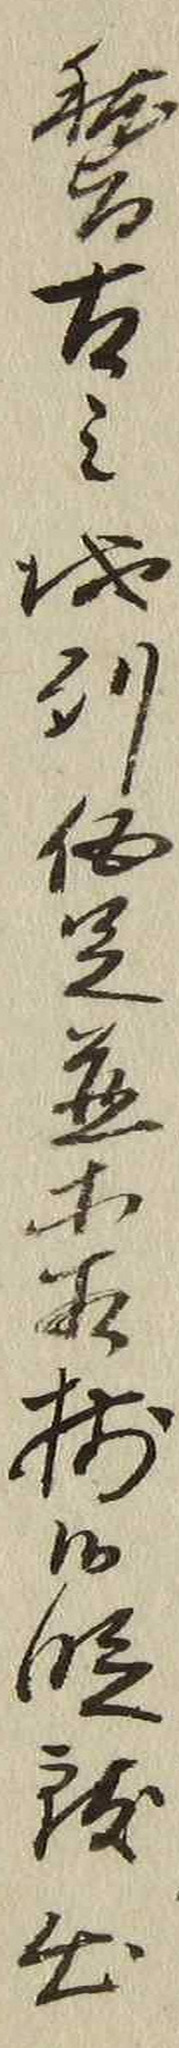稽古之儀列伍足並等相揃候段致出
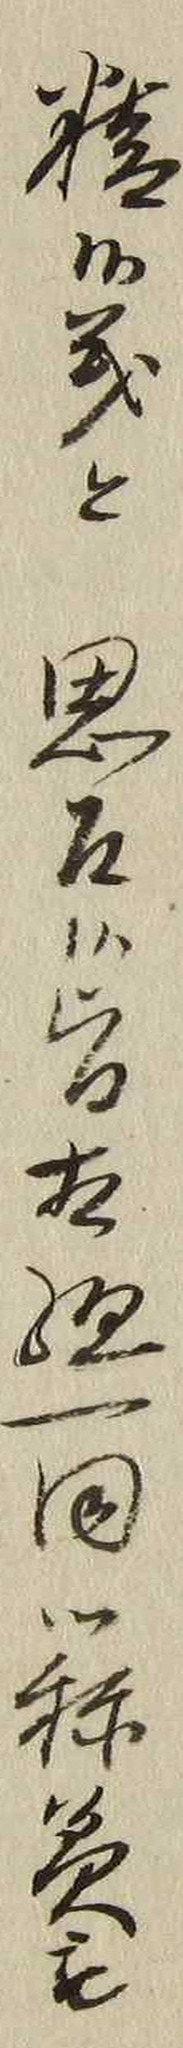精候義と思召候旨相組一同御称美被
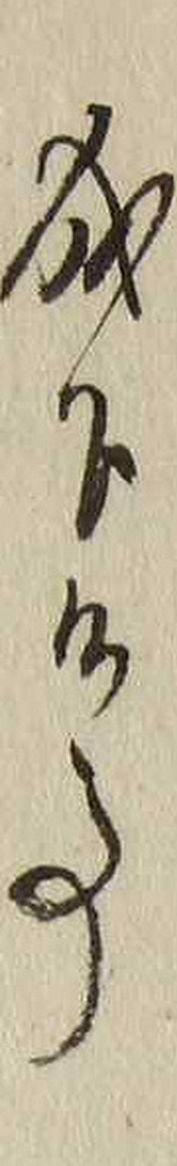成下候事
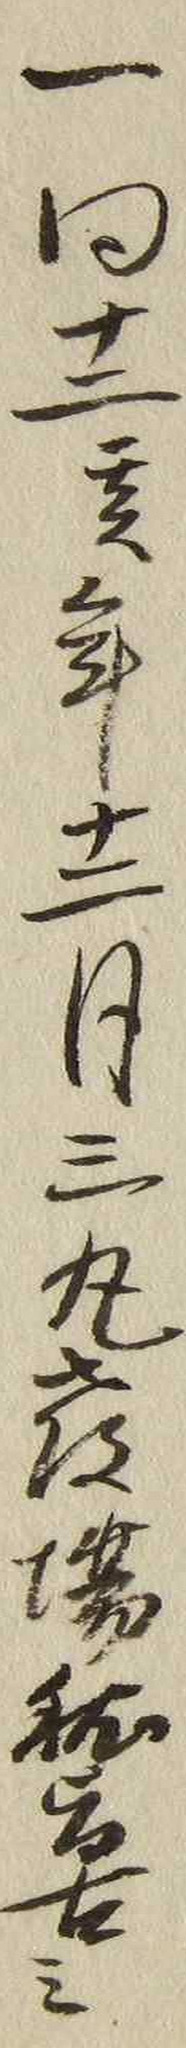一同十二亥年十二月三丸教場稽古之
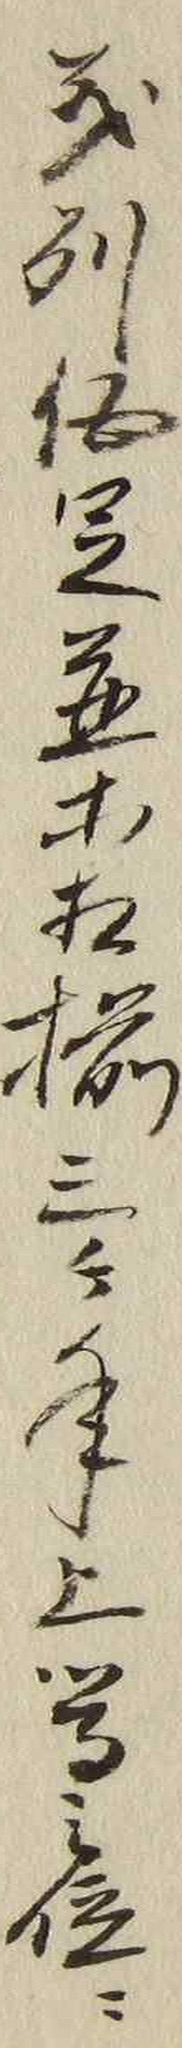義列伍足並等相揃三ケ年上等之位ニ
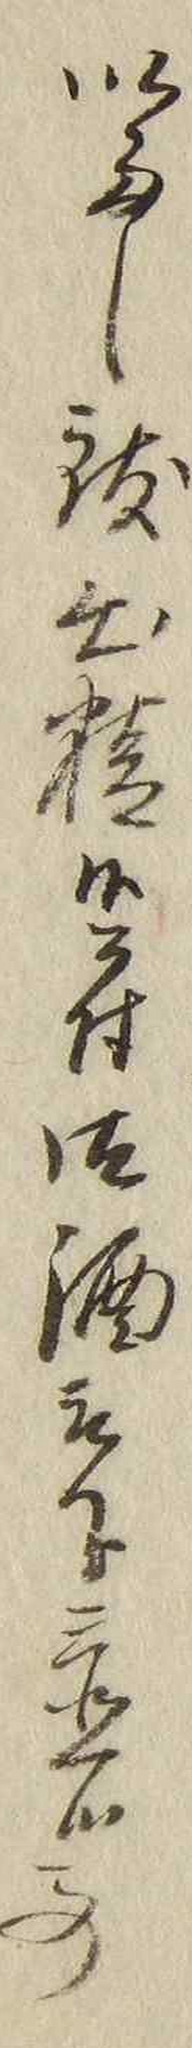いたし致出精候ニ付御酒被下置候事

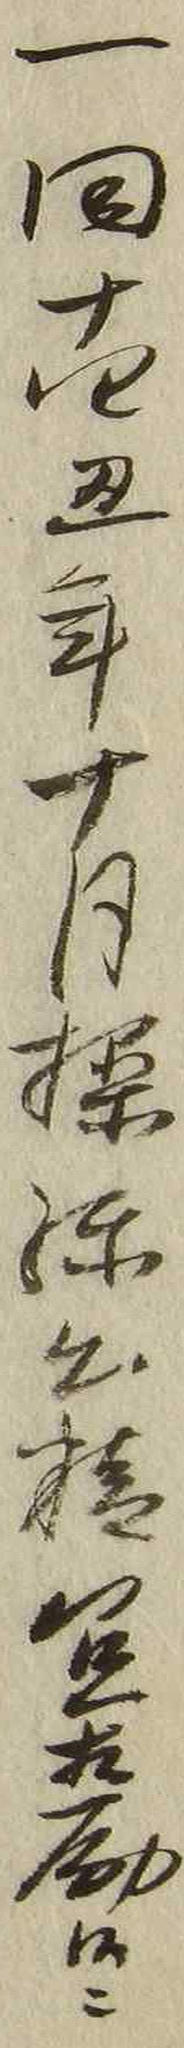一同十四丑年十月操練出精宜相励候ニ
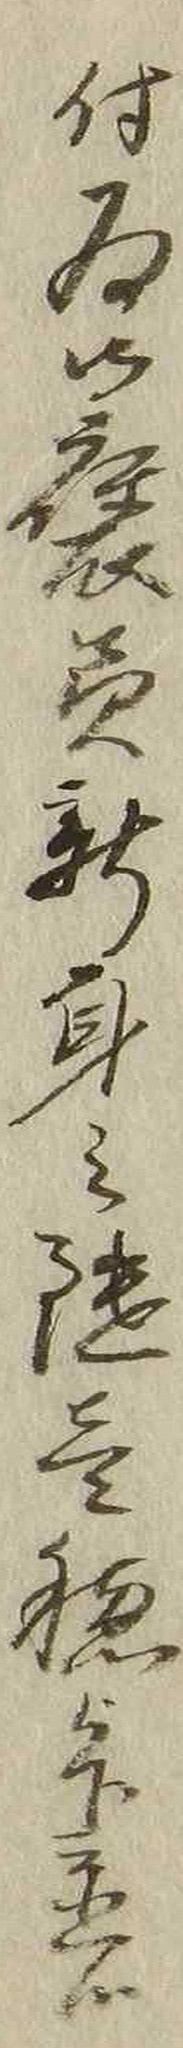付為御褒美新身之鑓壱穂被下置候
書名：諸士系譜　巻之359　す之部9
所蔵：会津若松市立会津図書館
